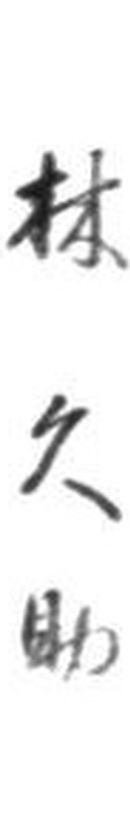林久助
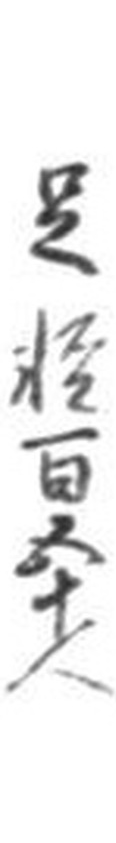足軽百五十人

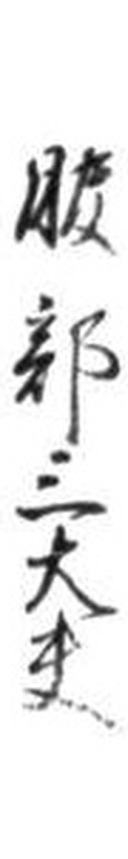服部三大夫
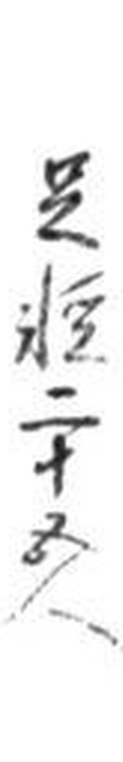足軽二十五人
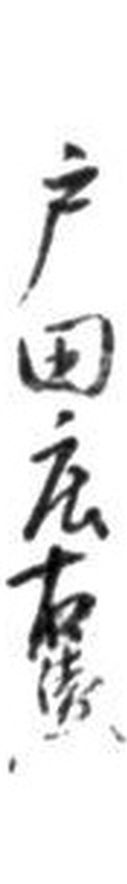戸田庄右衛門
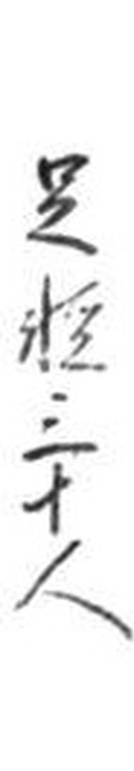足軽三十人
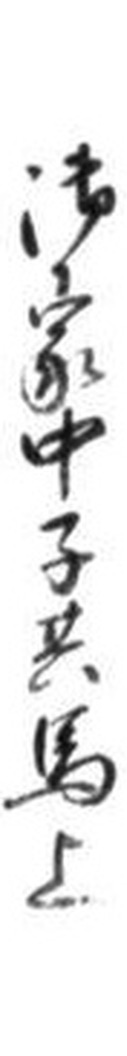御家中子共馬上
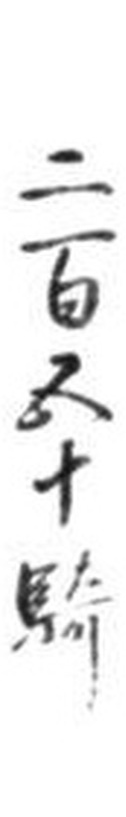二百五十騎
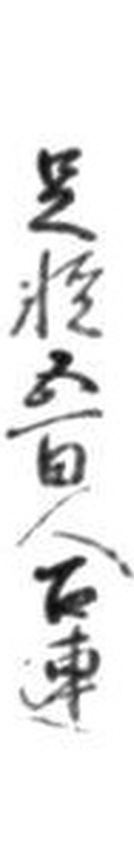足軽五百人召連
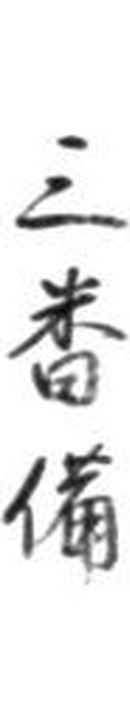三番備
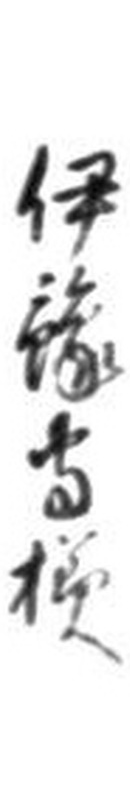伊予守様
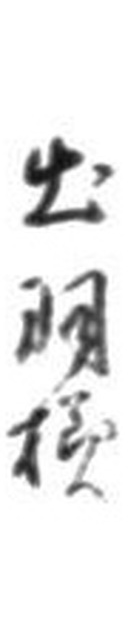出羽様
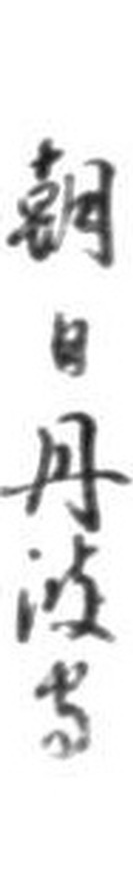朝日丹波守
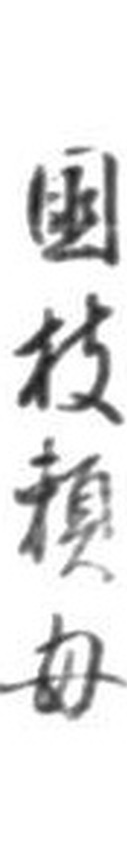国枝頼母
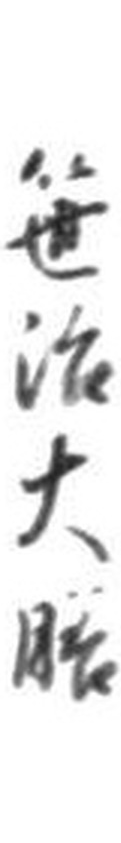笹治大膳
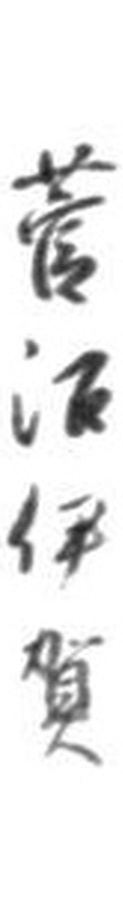菅沼伊賀
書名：家譜 二 忠直公 従文禄四年到慶安四年
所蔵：福井県文書館 Fukui Prefectural Archives
